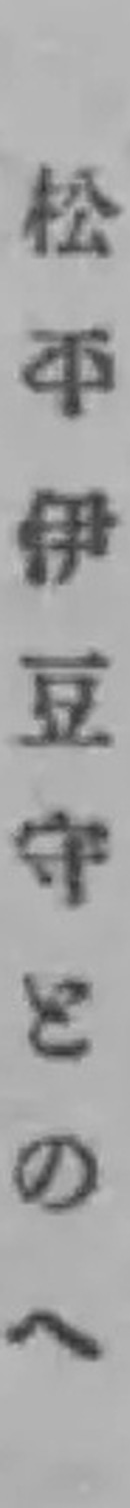松平伊豆守とのへ
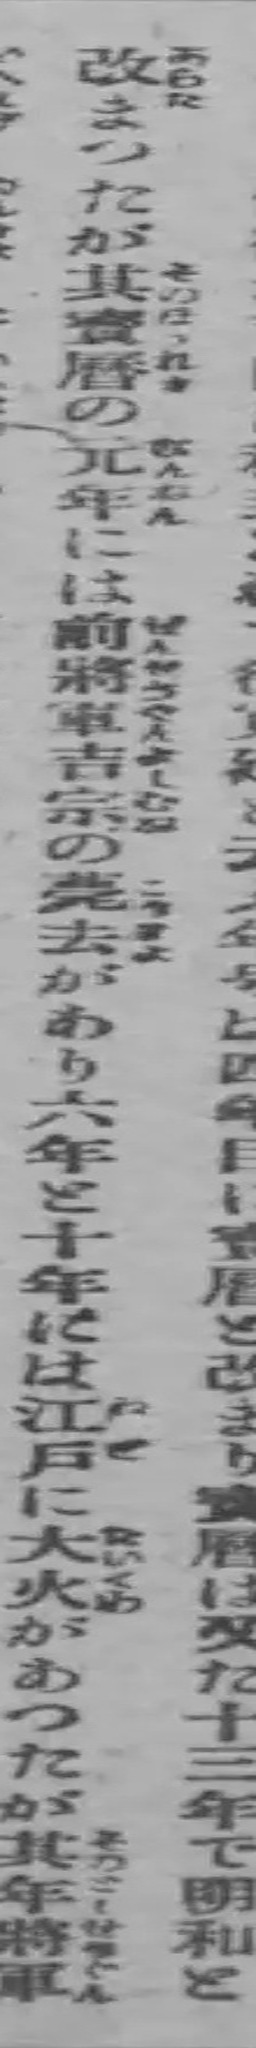改まつたが其宝暦の元年には前将軍吉宗の薨去があり六年と十年には江戸に大火があつたが其年将軍
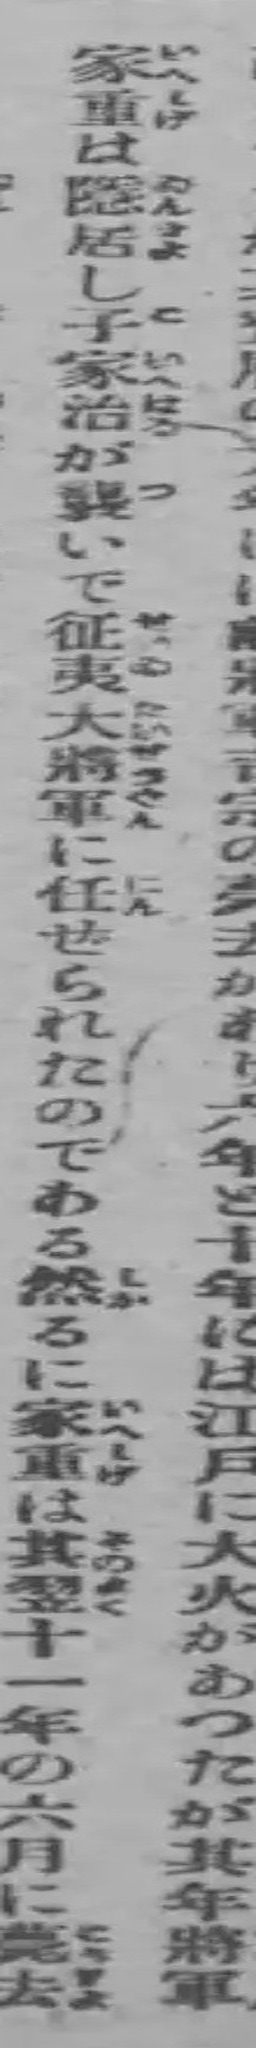家重は隠居し子家治が襲いで征夷大将軍に任ぜられたのである然るに家重は其翌十一年の六月に薨去
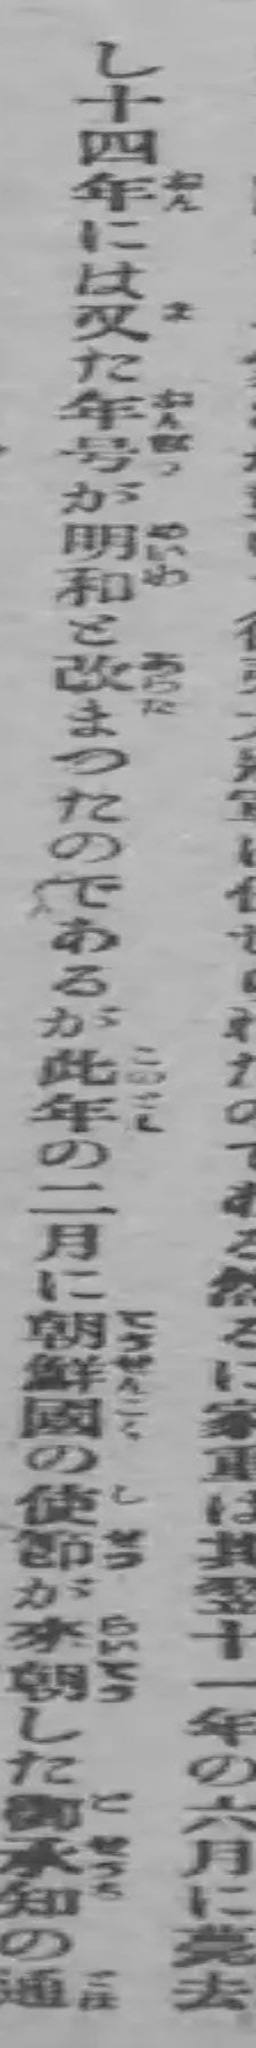し十四年には又た年号が明和と改まつたのであるが此年の二月に朝鮮国の使節が来朝した御承知の通
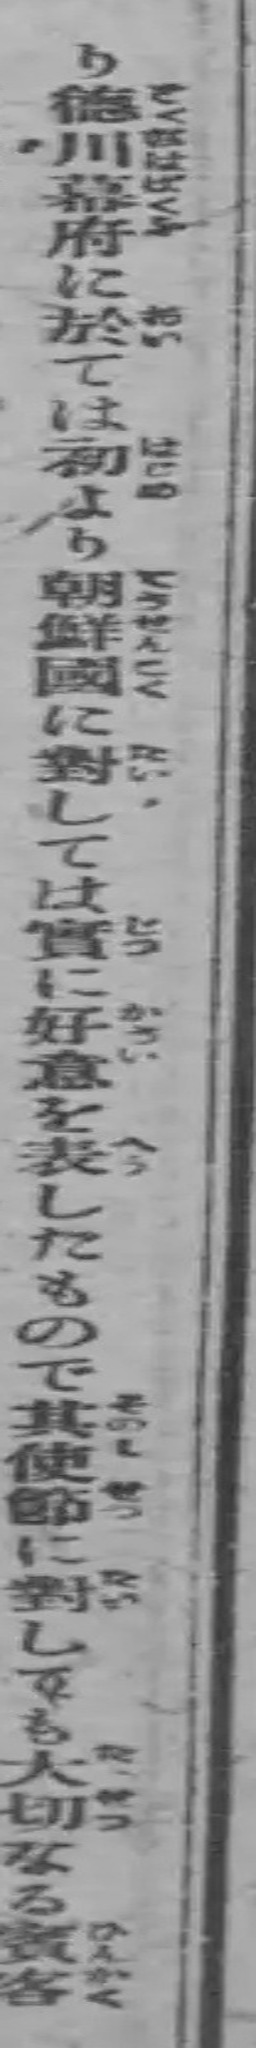り徳川幕府に於ては初より朝鮮国に対しては実に好意を表したもので其使節に対しても大切なる賓客
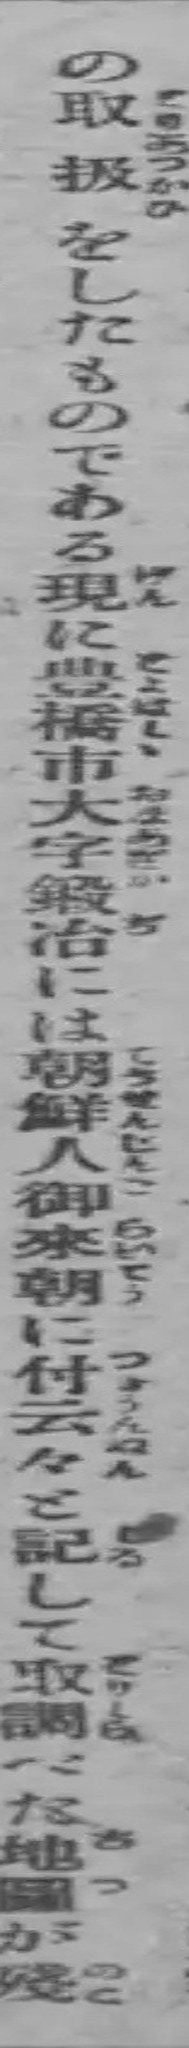の取扱をしたものである現に豊橋市大字鍛冶には朝鮮人御来朝に付云々と記して取調べた地図が残
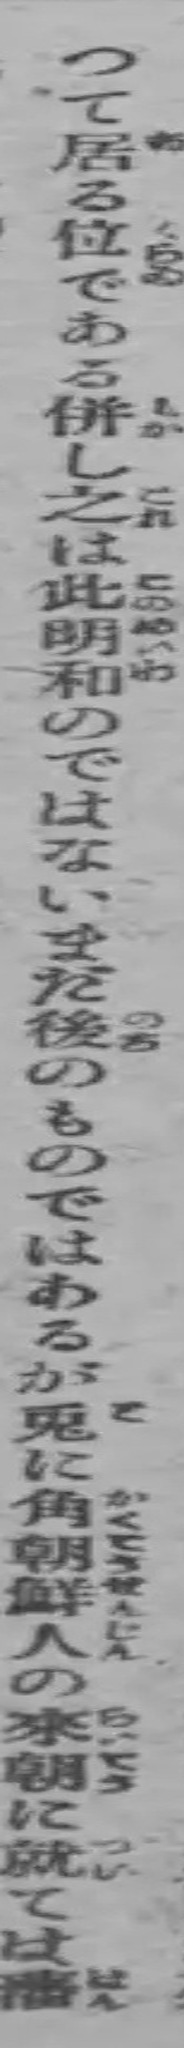つて居る位である併し之は此明和のではないまだ後のものではあるが兎に角朝鮮人の来朝に就ては藩
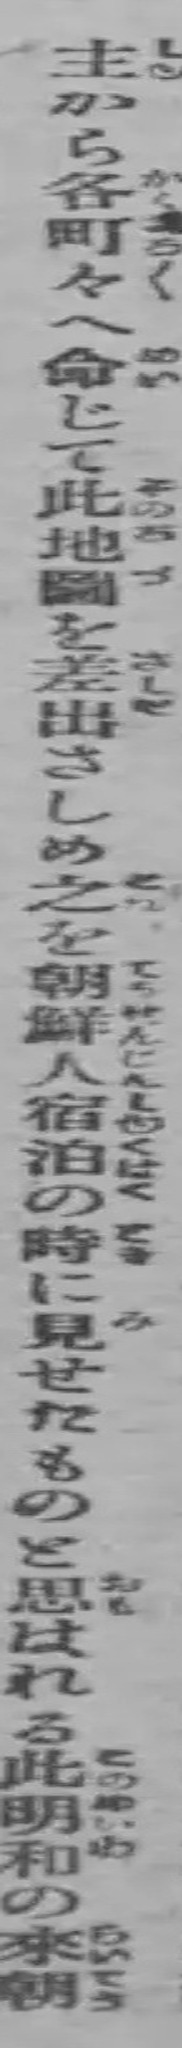主から各町々へ命じて此地図を差出さしめ之を朝鮮人宿泊の時に見せたものと思はれる此明和の来朝
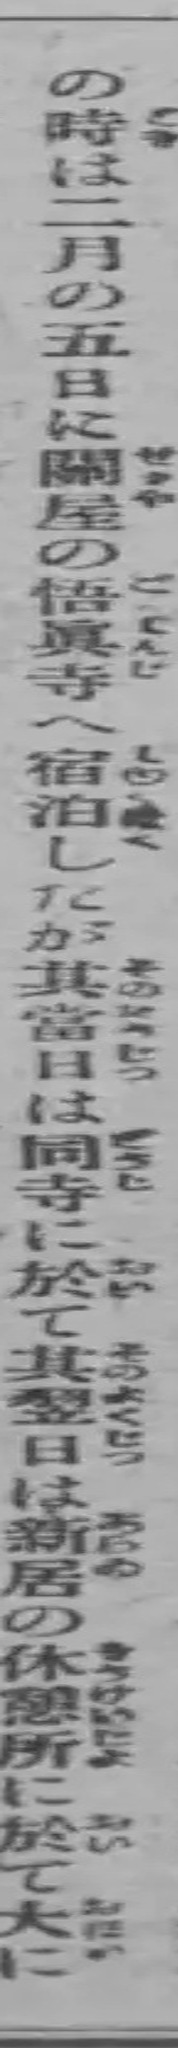の時は二月の五日に関屋の悟眞寺へ宿泊したが其当日は同寺に於て其翌日は新居の休憩所に於て大に
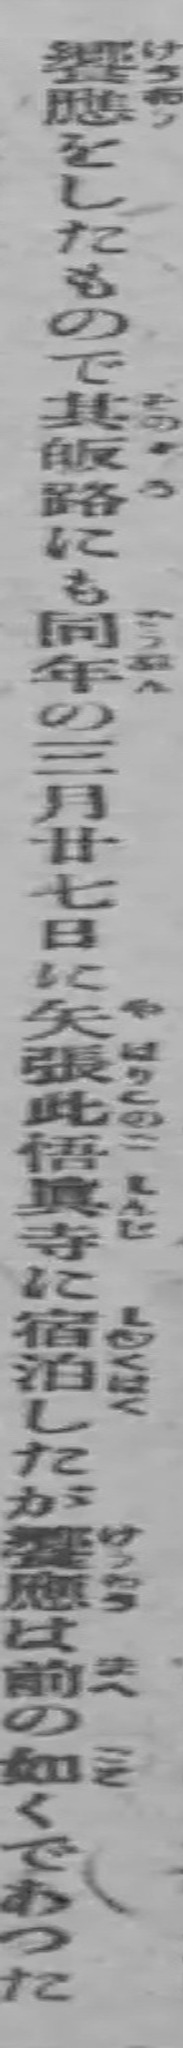饗応をしたもので其皈路にも同年の三月廿七日に矢張此悟眞寺に宿泊したが饗応は前の如くであつた
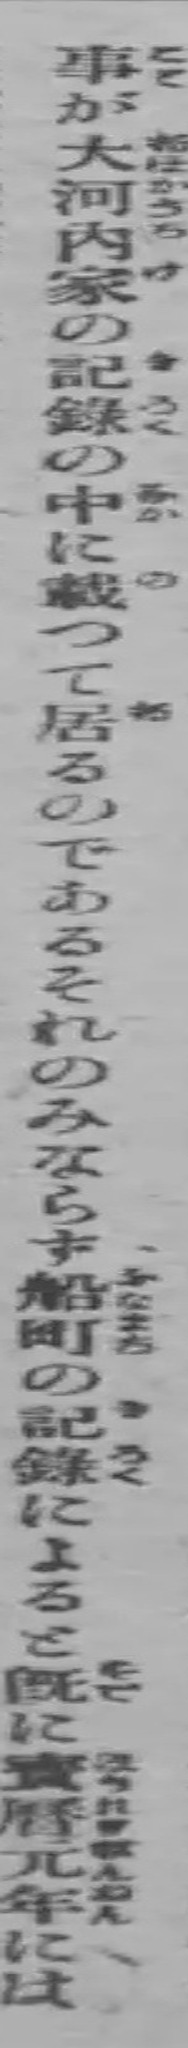事が大河内家の記録の中に載つて居るのであるそれのみならず船町の記録によると既に宝暦元年には
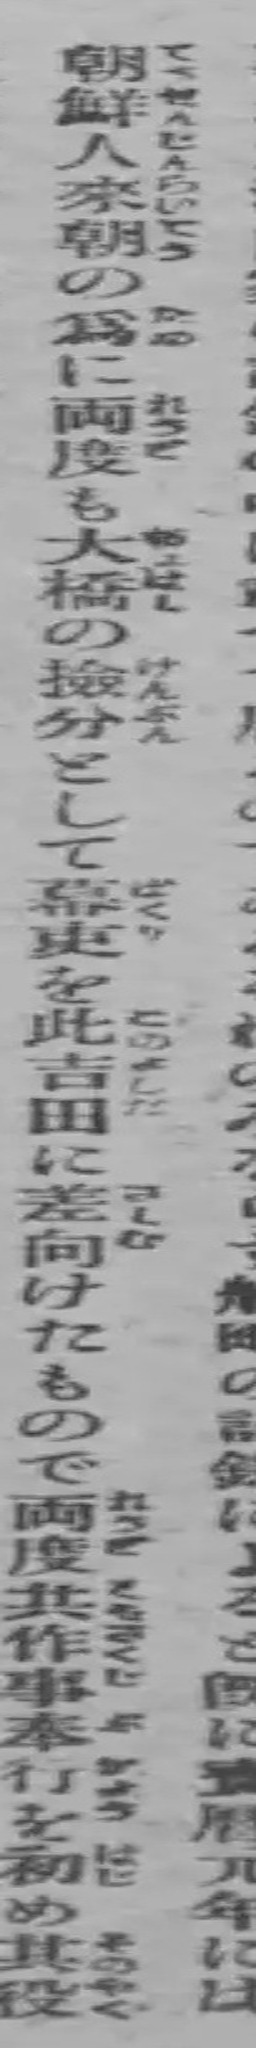朝鮮人来朝の為に両度も大橋の検分として幕吏を此吉田に差向けたもので両度共作事奉行を初め其役
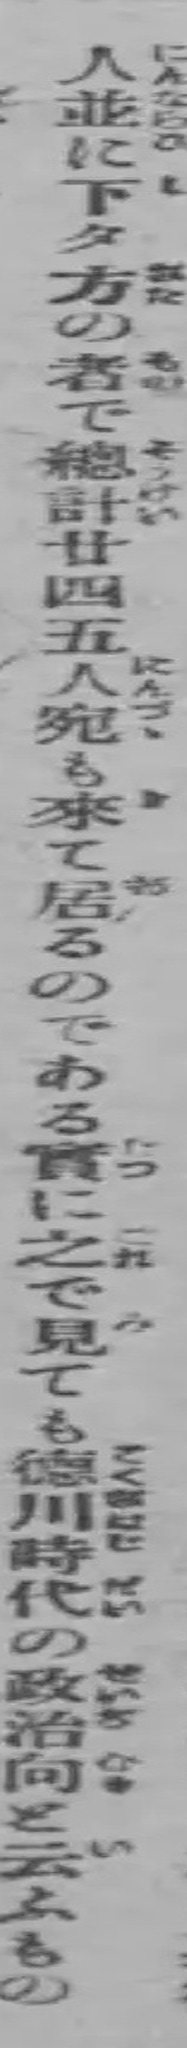人並に下タ方の者で総計廿四五人宛も来て居るのである実に之で見ても徳川時代の政治向と云ふもの
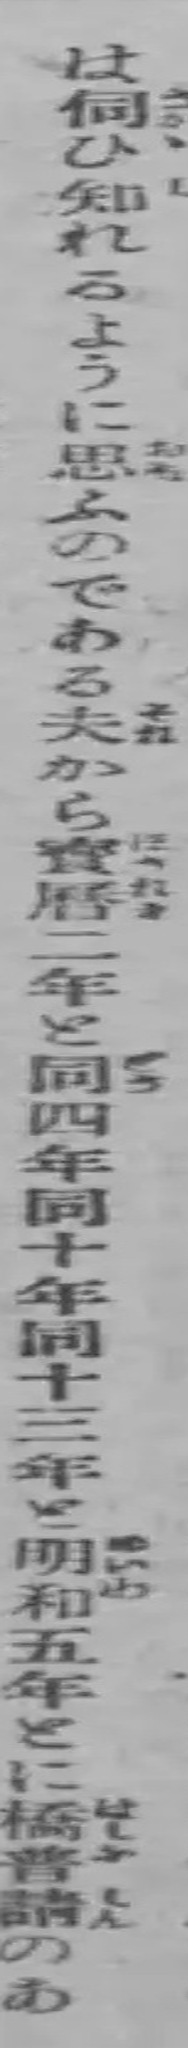は伺ひ知れるように思ふのである夫から宝暦二年と同四年同十年同十三年と明和五年とに橋普請のあ
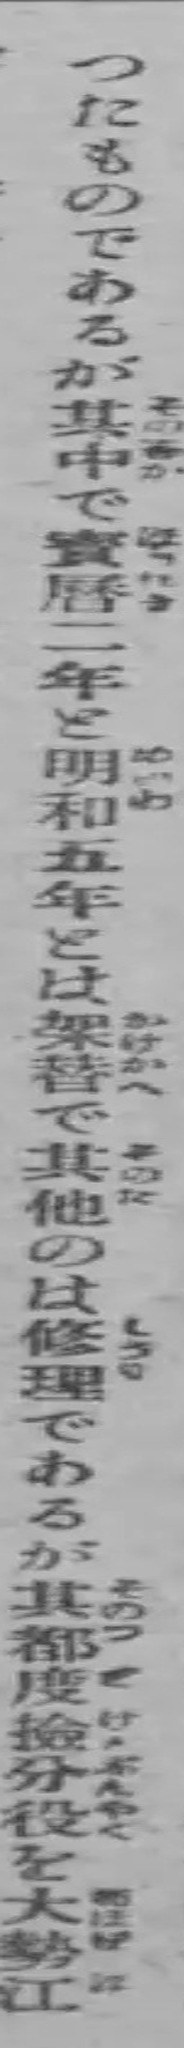つたものであるが其中で宝暦二年と明和五年とは架替で其他のは修理であるが其都度検分役を大勢江
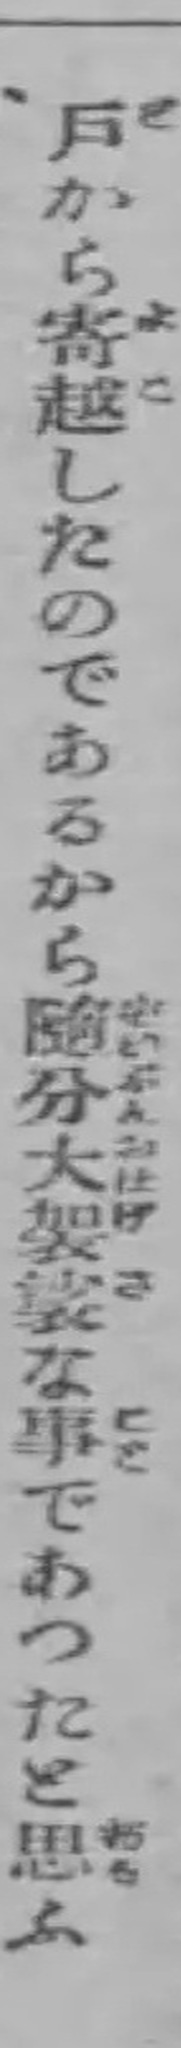戸から寄越したのであるから随分大袈裟な事であつたと思ふ
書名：豊橋市史談
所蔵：国立国会図書館 National Diet Library, JAPAN
